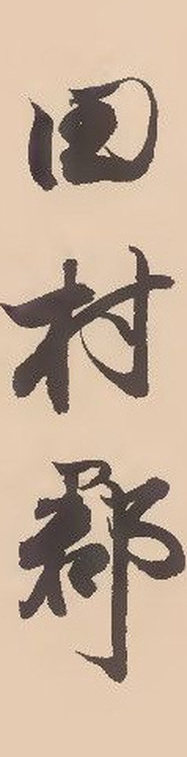田村郡
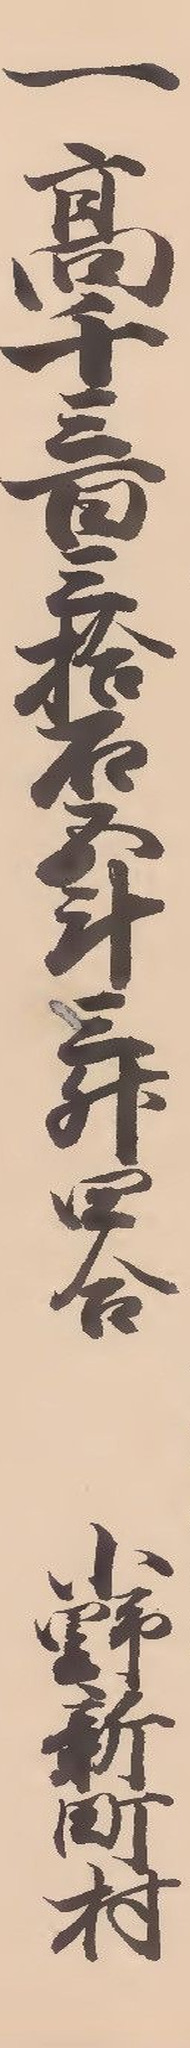一高千三百三拾石五斗三升四合小野新町村
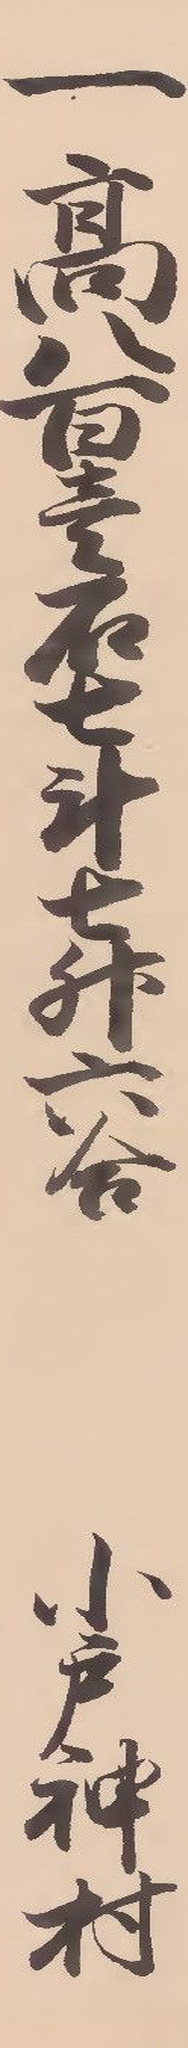一高八百壱石七斗七升六合小戸神村
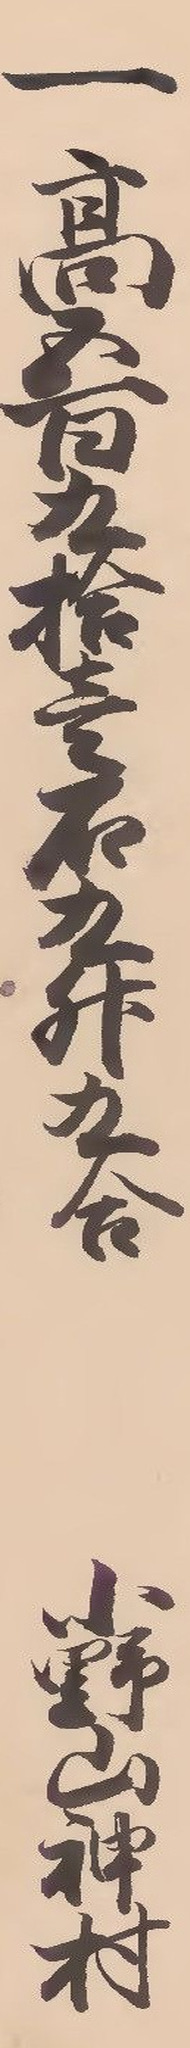一高五百九拾壱石九升九合小野山神村

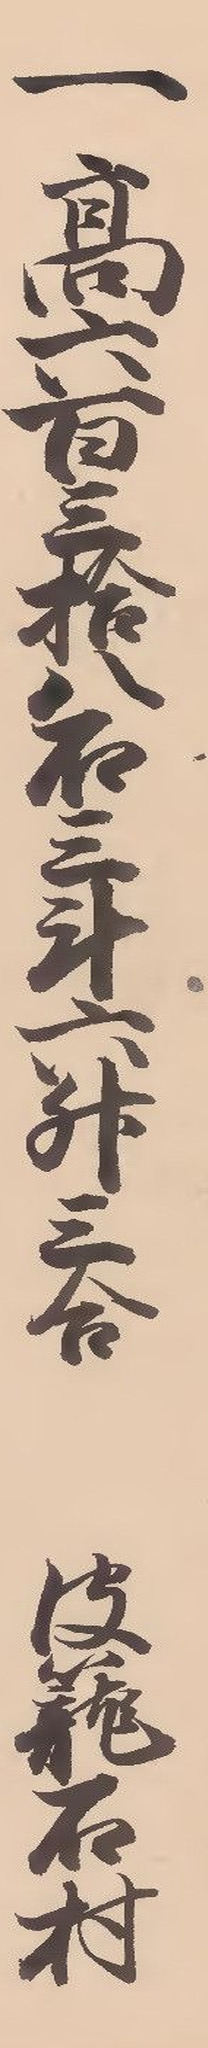一高六百三拾八石三斗六升三合皮篭石村
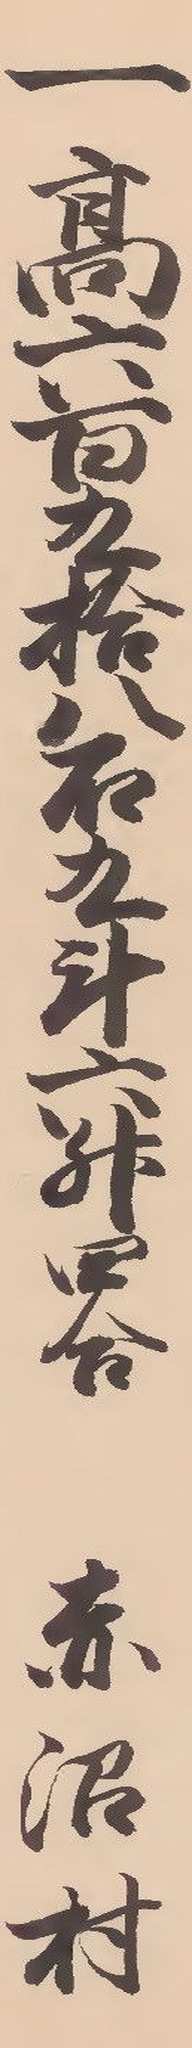一高六百九拾八石九斗六升四合赤沼村
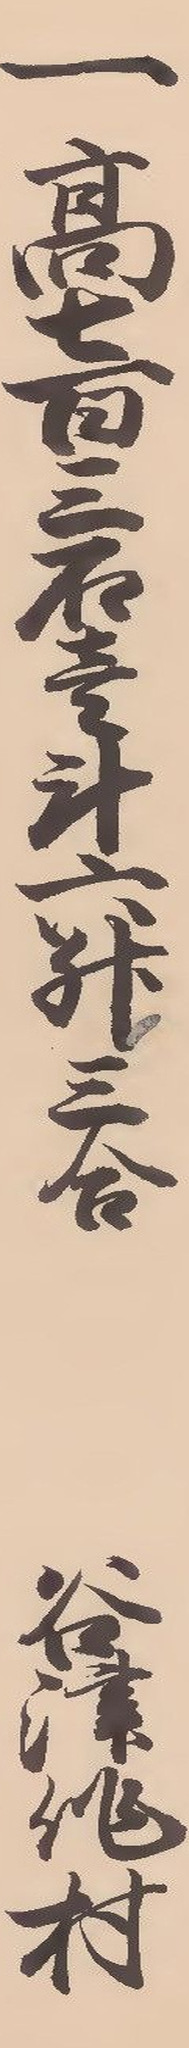一高七百三石壱斗六升三合谷津作村
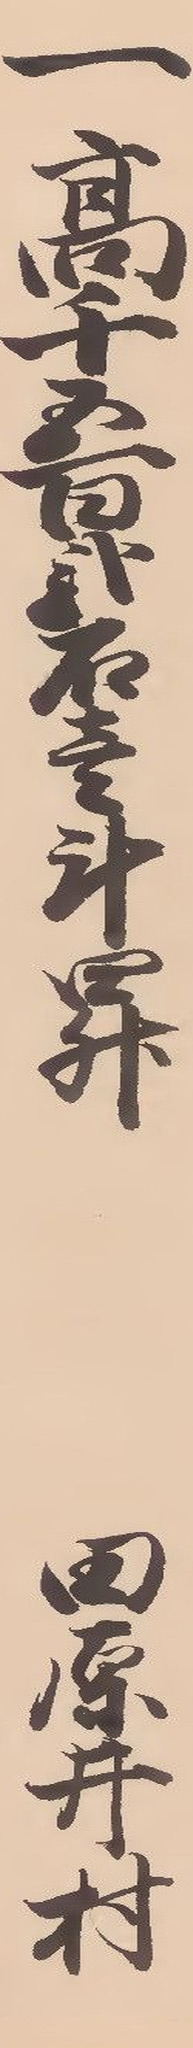一高千五百弐石壱斗四升田原井村
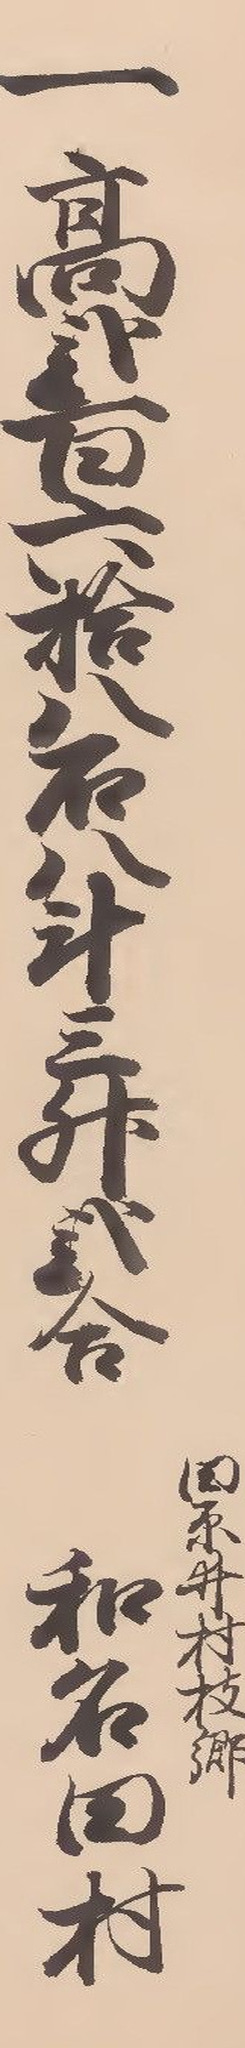一高弐百六拾八石八斗三升弐合和名田村
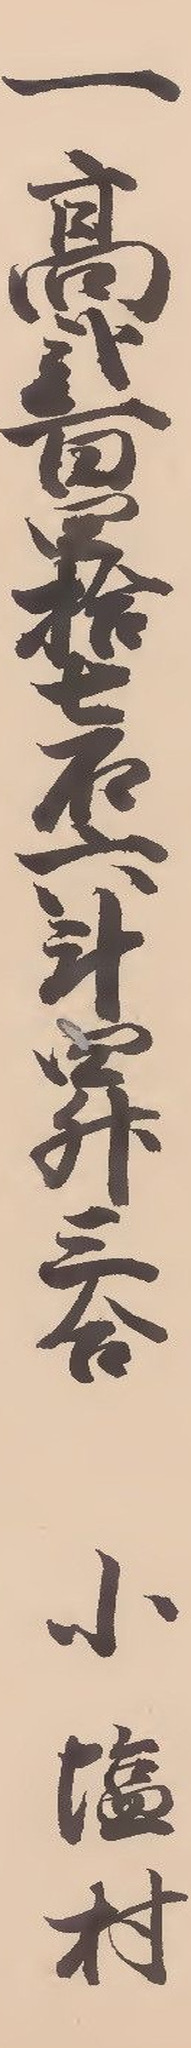一高弐百四拾七石六斗四升三合小塩村
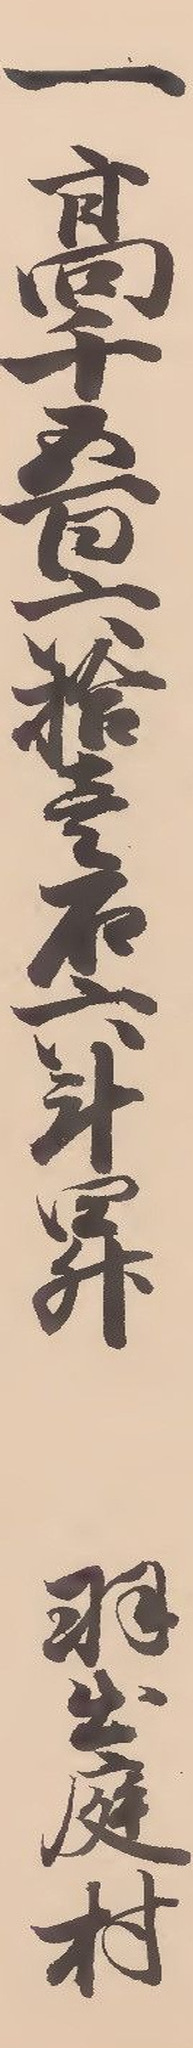一高千五百六拾壱石六斗四升羽出庭村
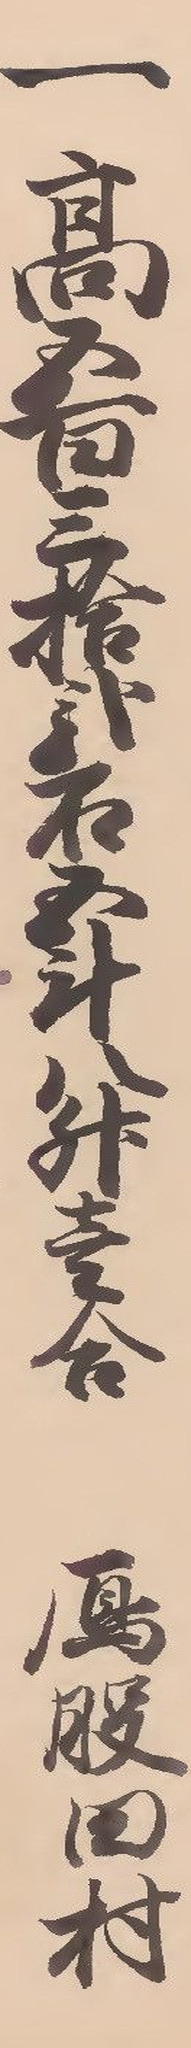一高五百三拾弐石五斗八升壱合雁股田村

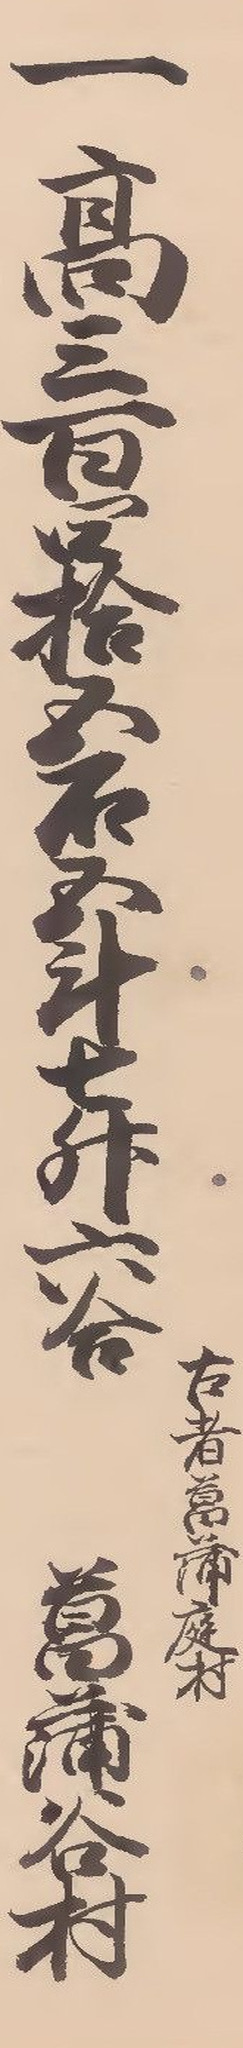一高三百四拾五石五斗七升六合菖蒲谷村
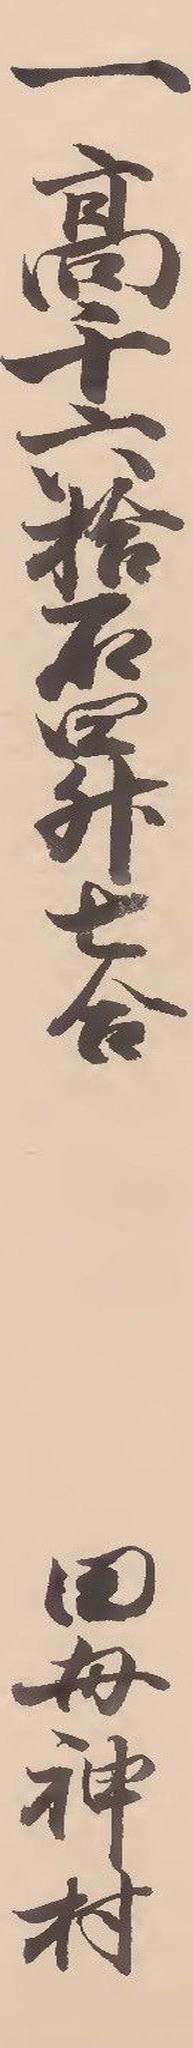一高千六拾石四升七合田母神村
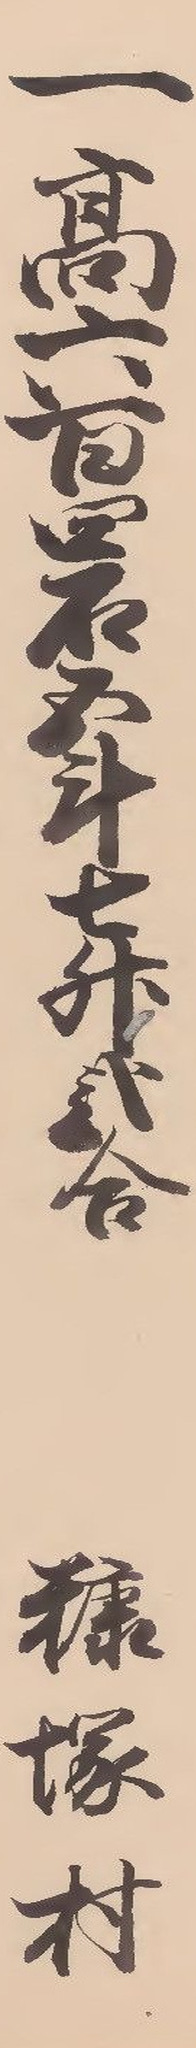一高六百四石五斗七升弐合糠塚村
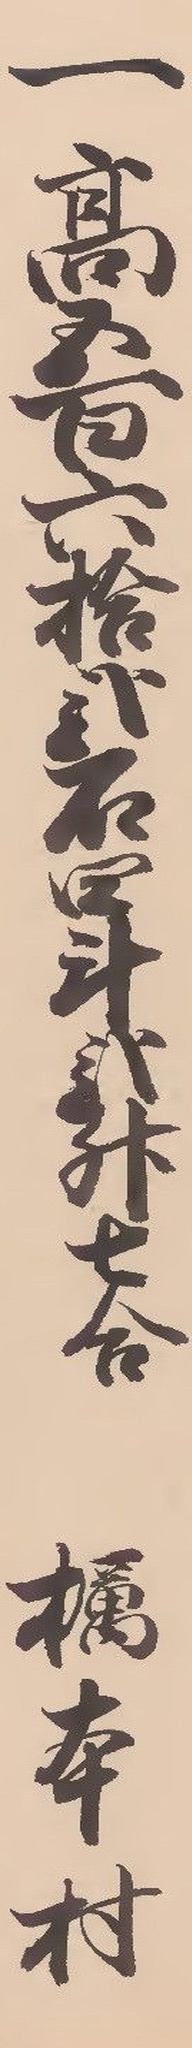一高五百六拾弐石四斗弐升七合栃本村
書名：陸奥国郷帳　２
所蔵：国立公文書館 National Archives of Japan
